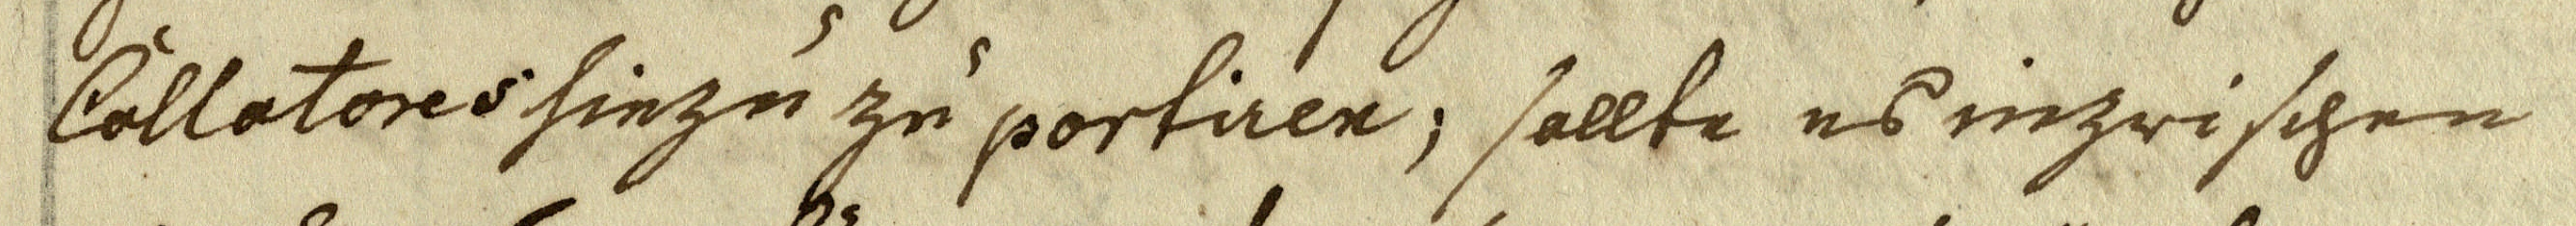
Collatores hiezu zu portiren, sollte es inzwischen
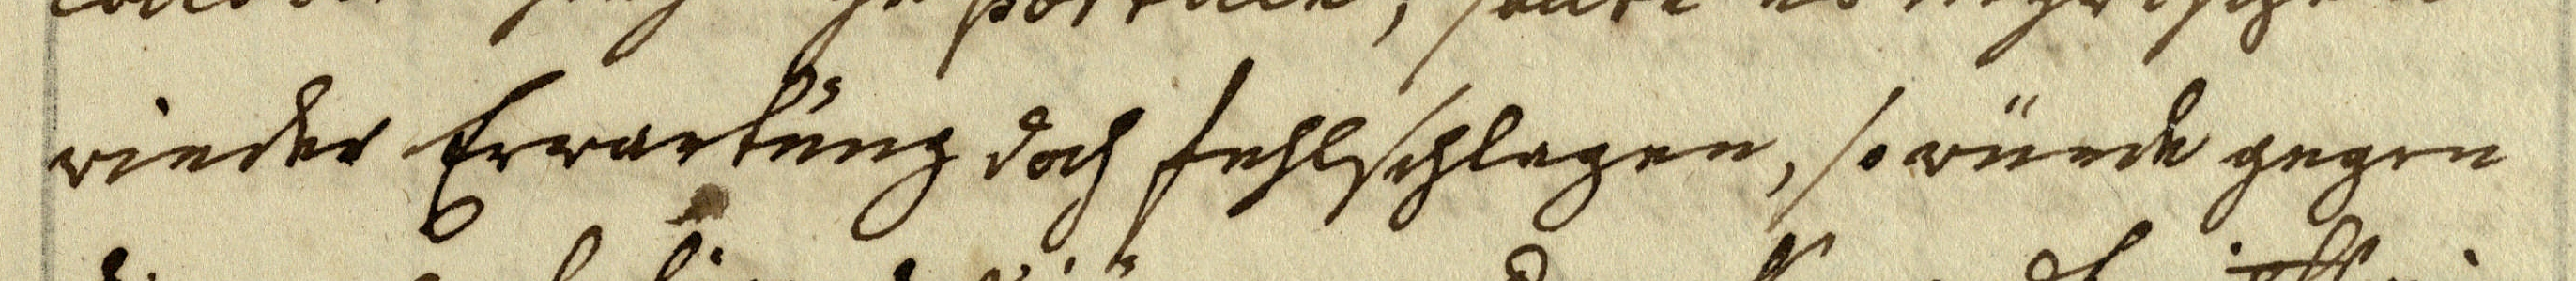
wieder Erwartung doch fehlschlagen, so würde gegen
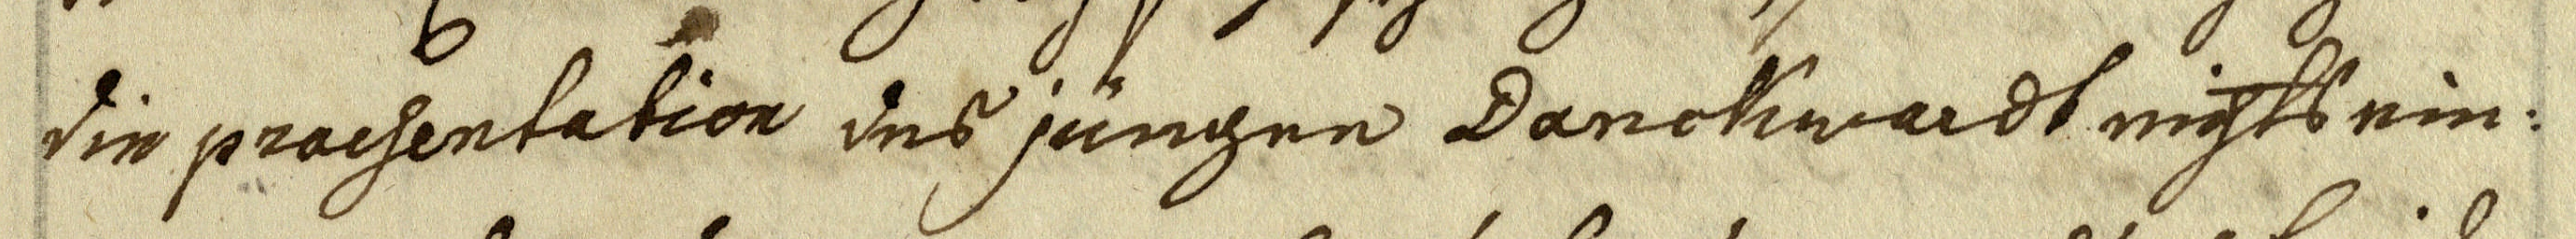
die praesentation des jungen Danckwardt nichts ein¬
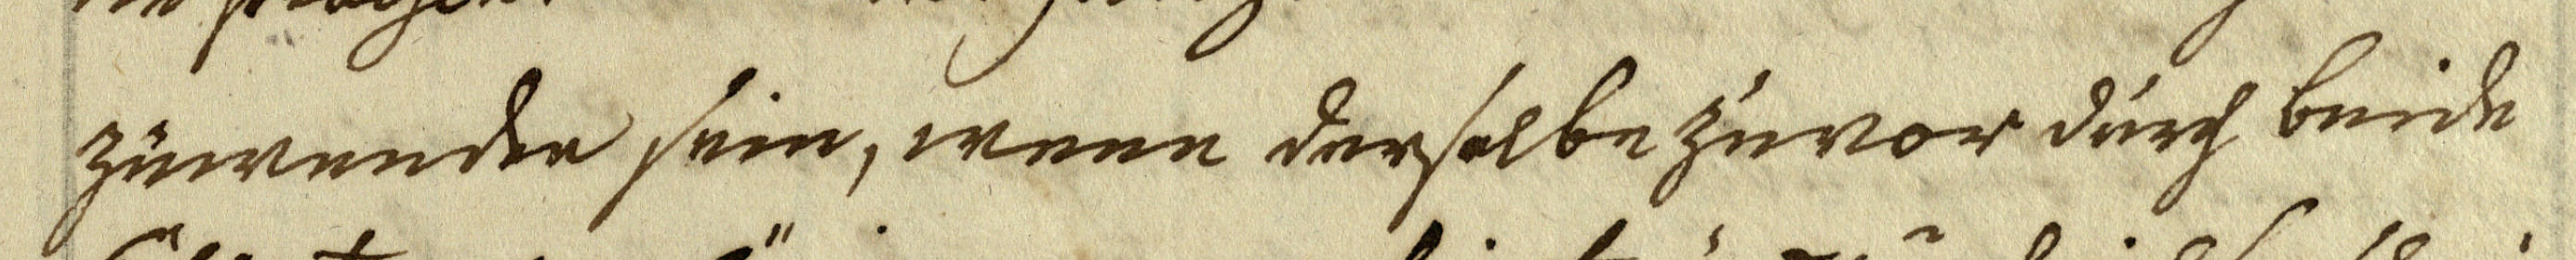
zuwenden sein, wenn derselbe zuvor durch beide
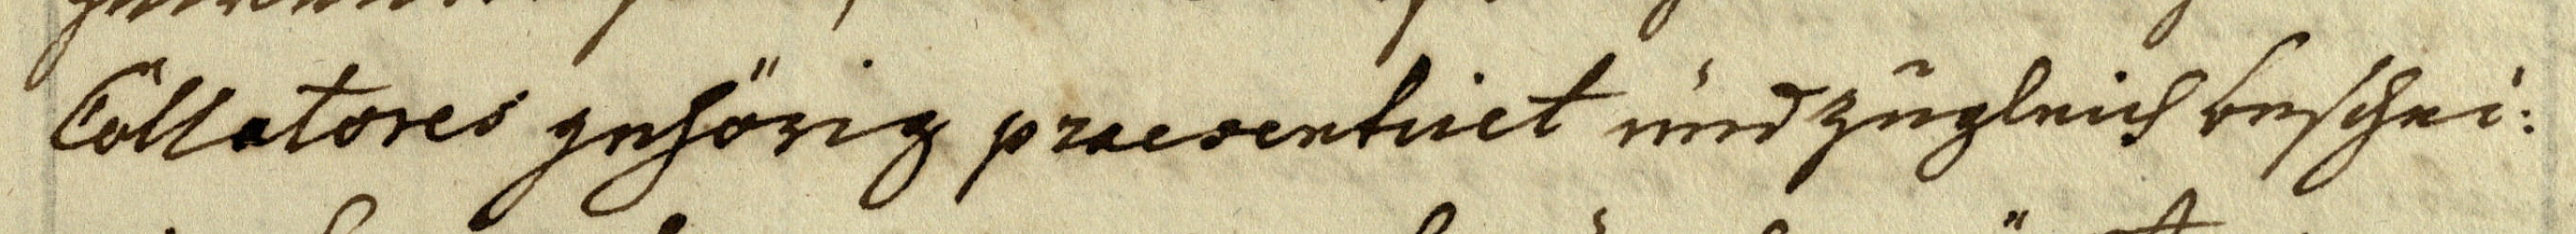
Collatores gehörig praesentiret und zugleich beschei¬
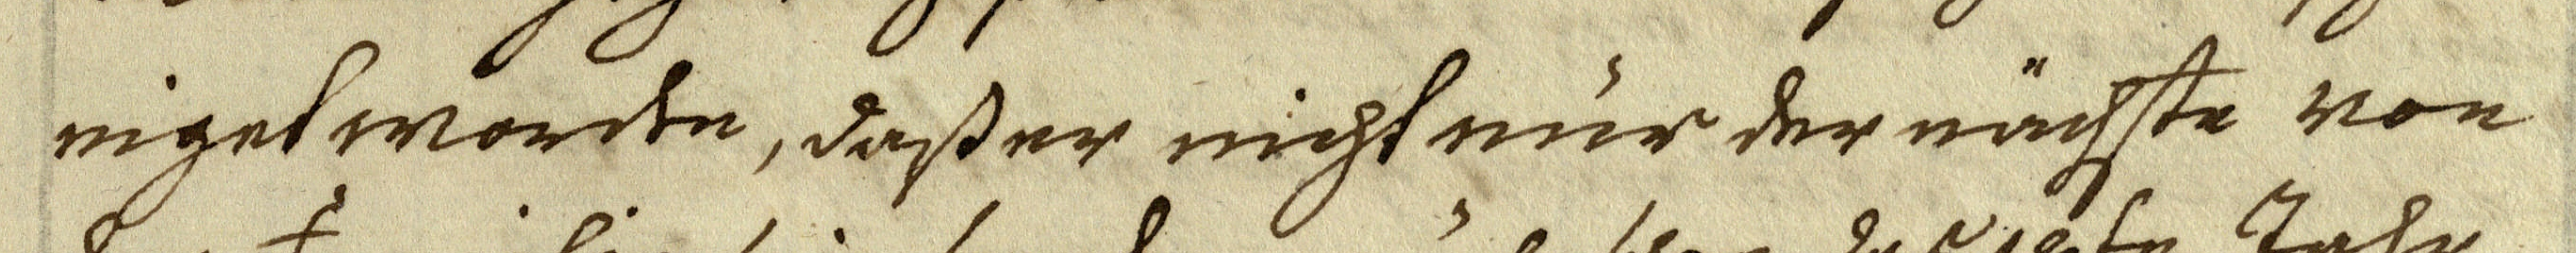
niget worden, daß er nicht nur der nächste von
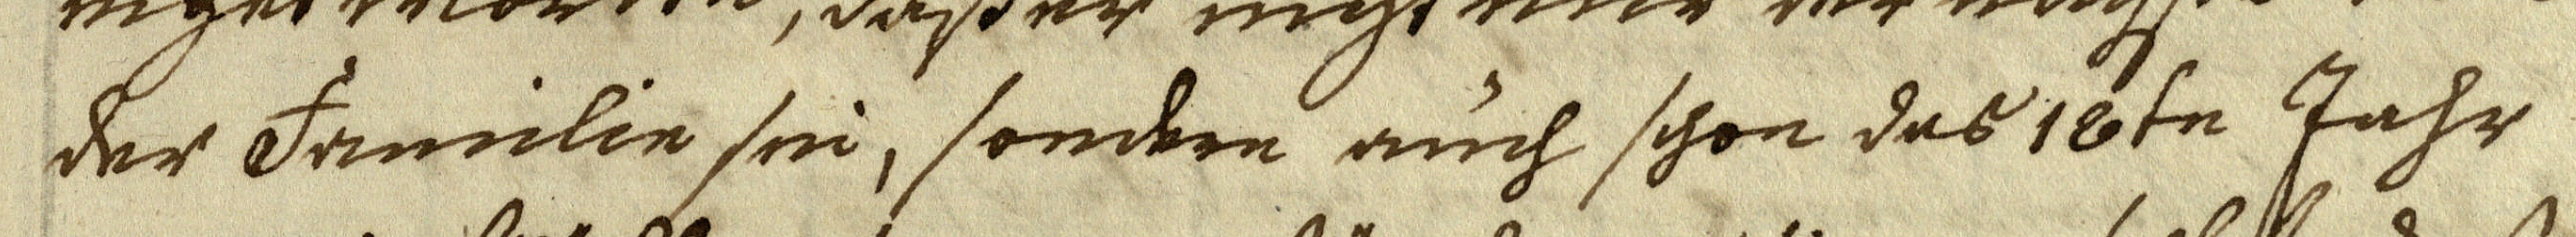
der Familie sei, sondern auch schon das 18 te Jahr
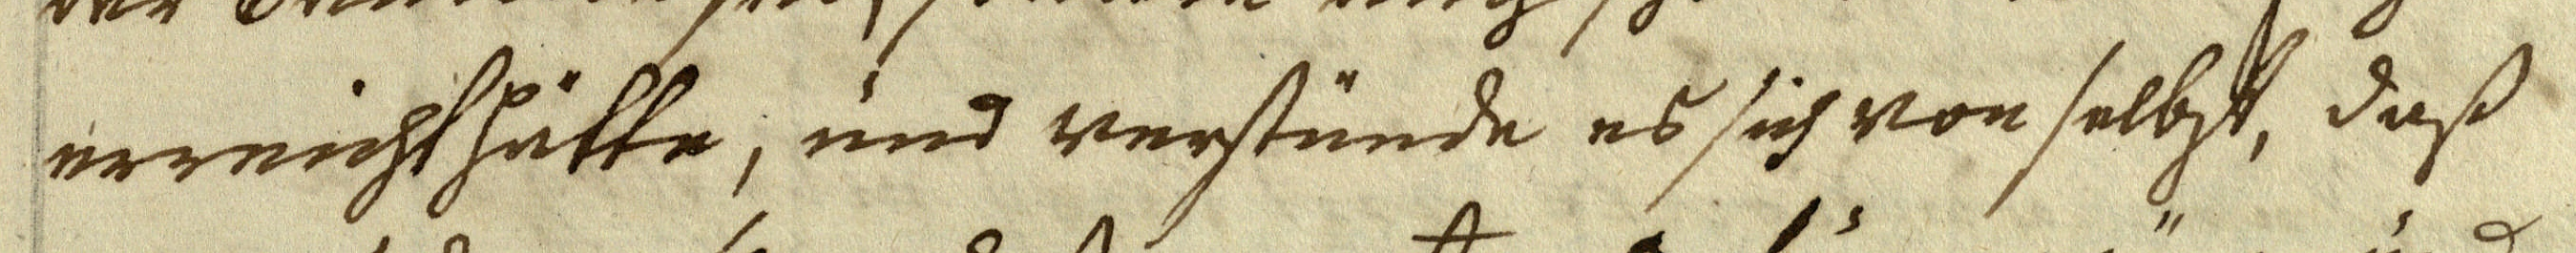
erreicht hätte,und verstünde es sich von selbst, daß
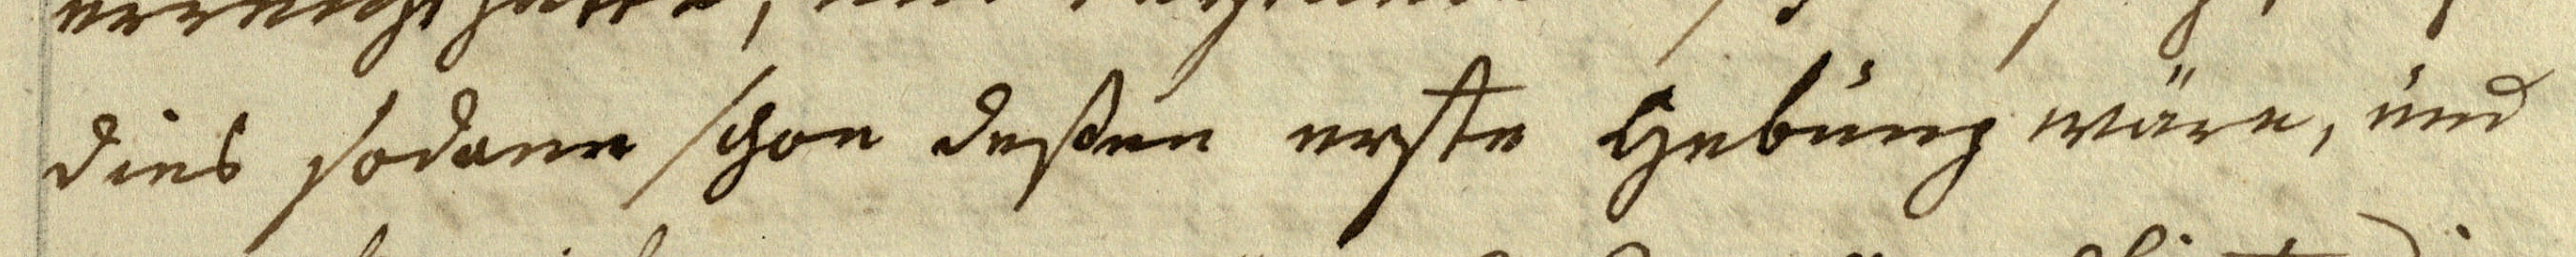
dies sodann schon deßen erste Hebung wäre, und
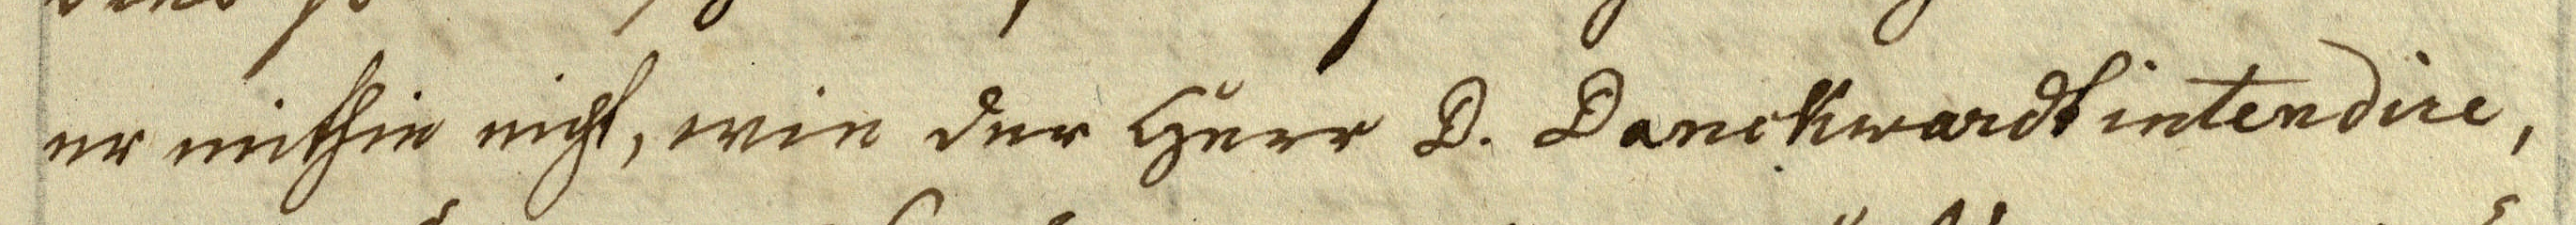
er mithin nicht, wie der Herr D. Danckwardt intendire,
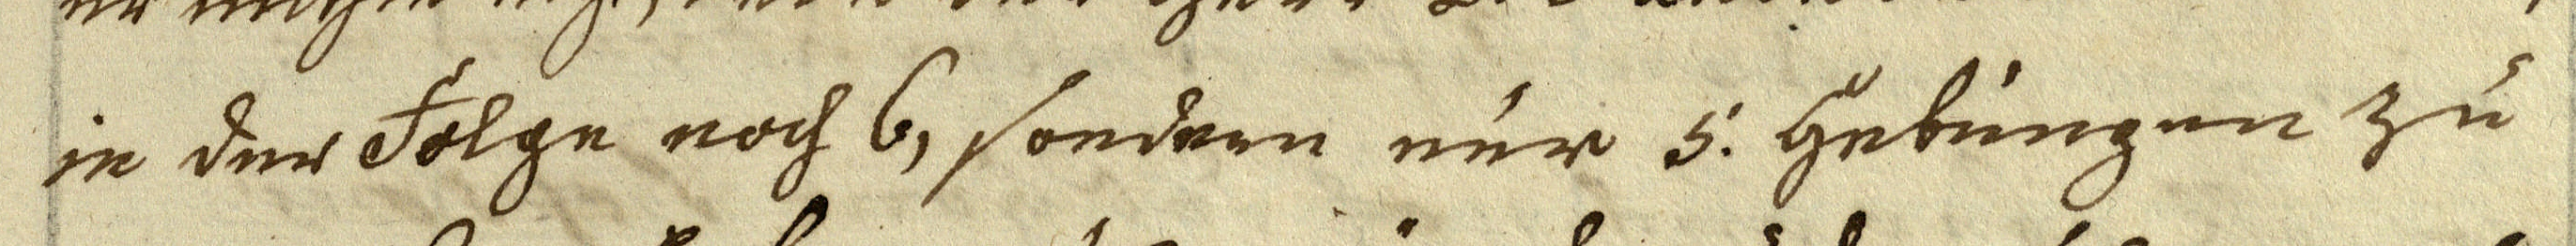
in der Folge noch 6, sondern nur 5. Hebungen zu
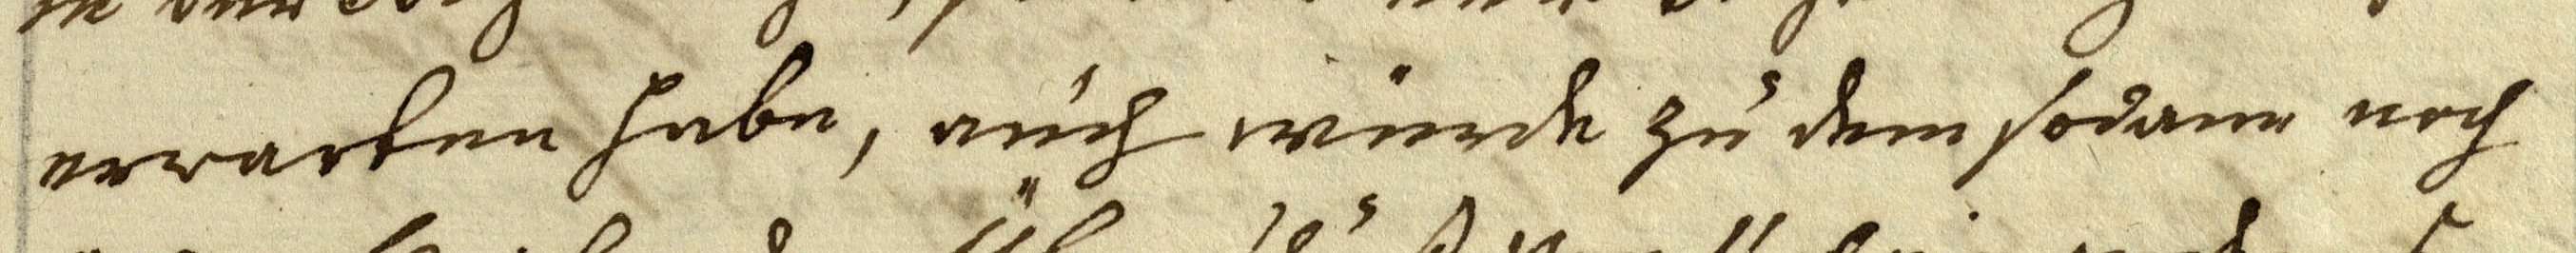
erwarten habe, auch würde zu dem sodann noch
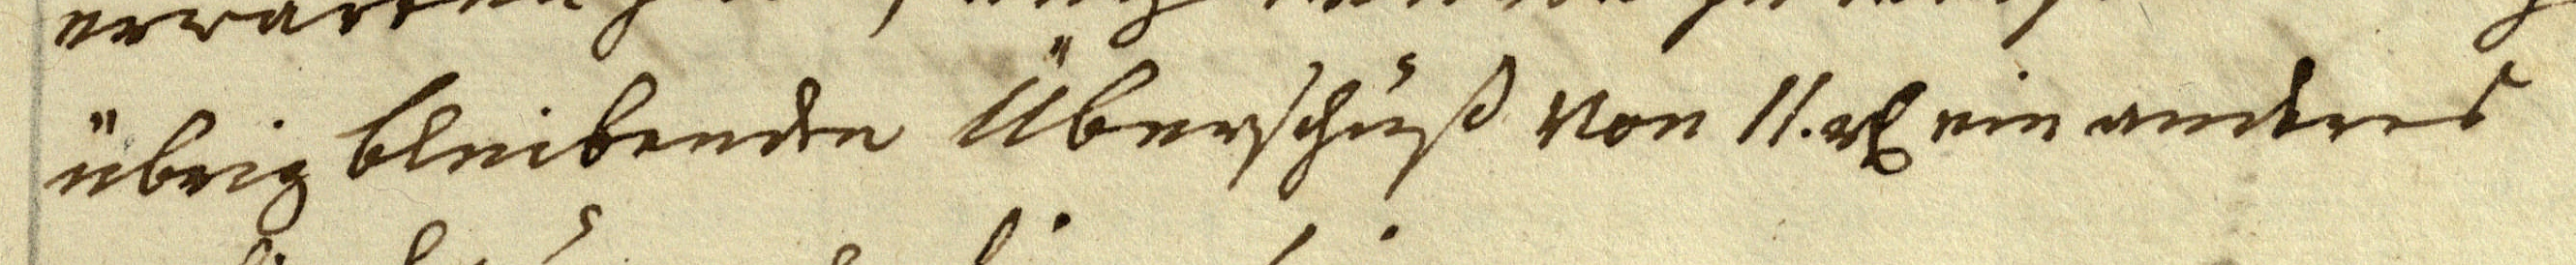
übrig bleibenden Überschuß von 11. r. ein anderes
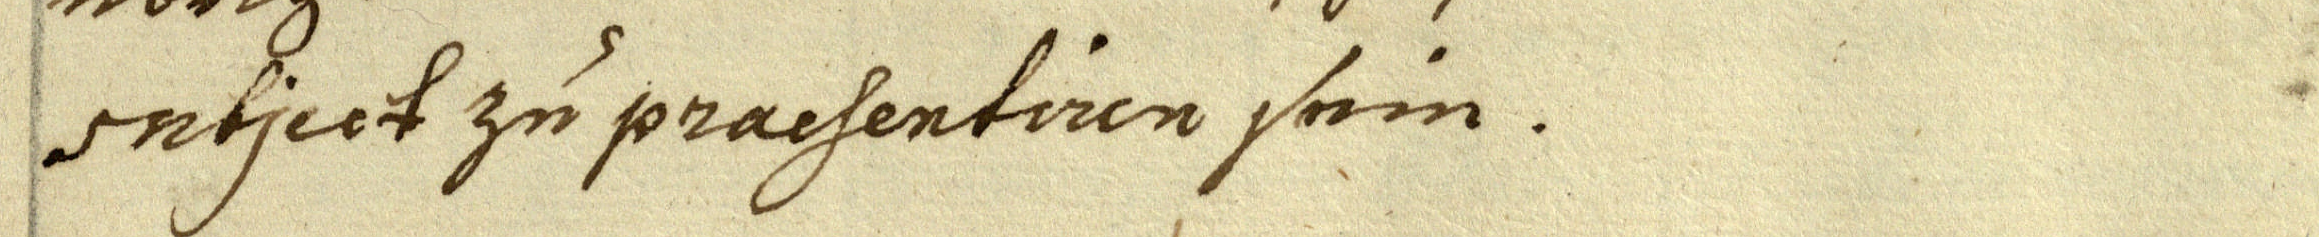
subject zu praesentiren sein.
